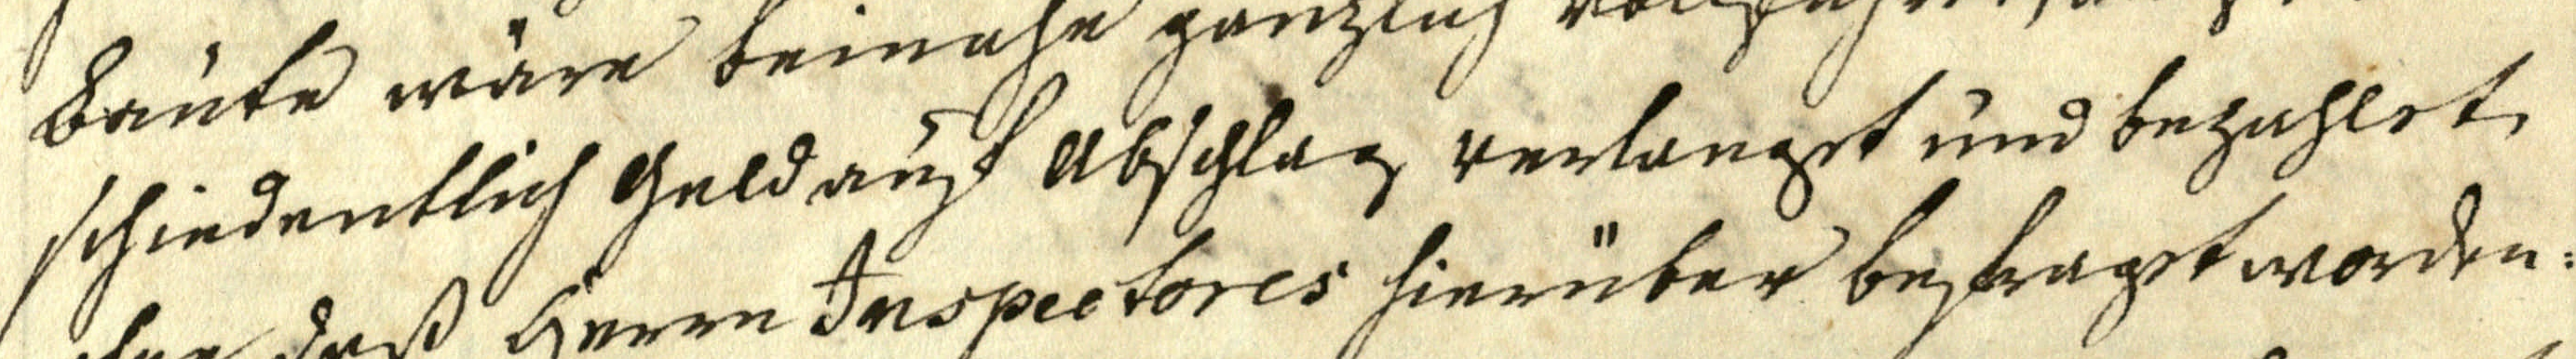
schiedentlich Geld auf Abschlag verlanget und bezahlet,
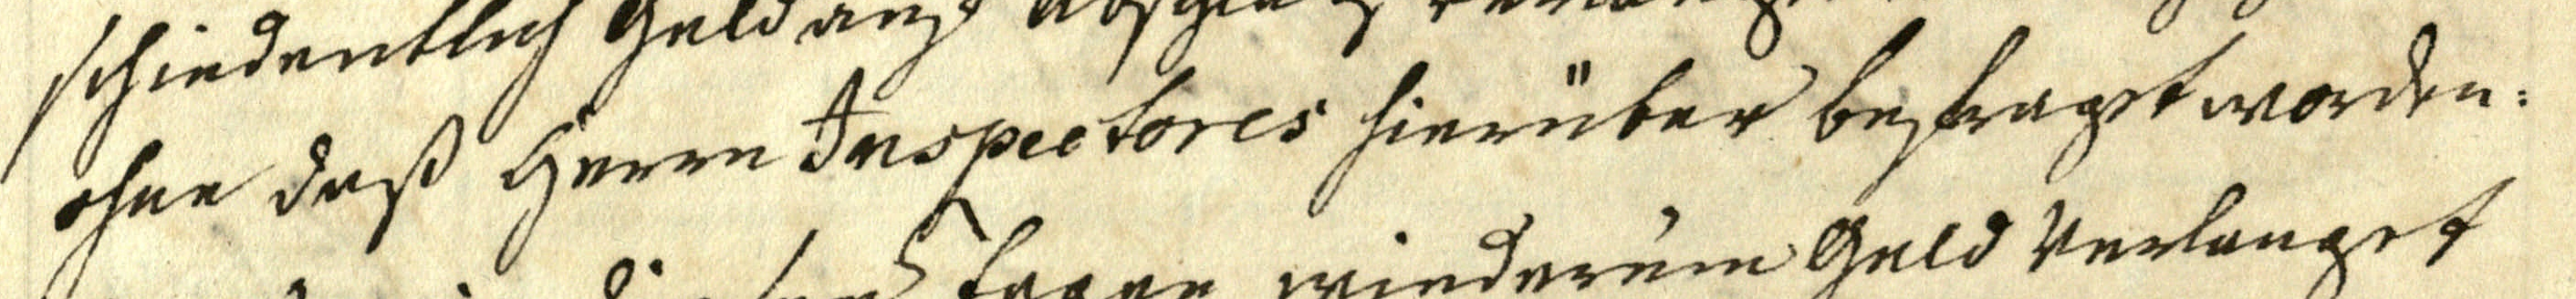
ohne daß Herrn Inspectores hierüber befraget worden.
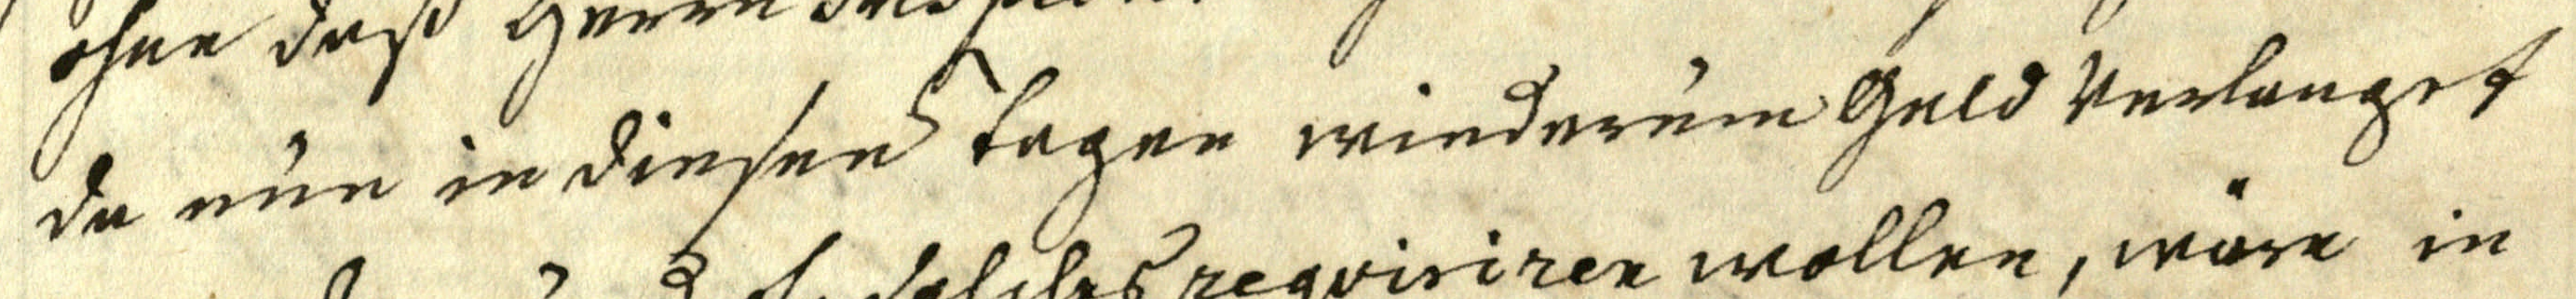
da nun in diesen Tagen wiederum Geld verlanget
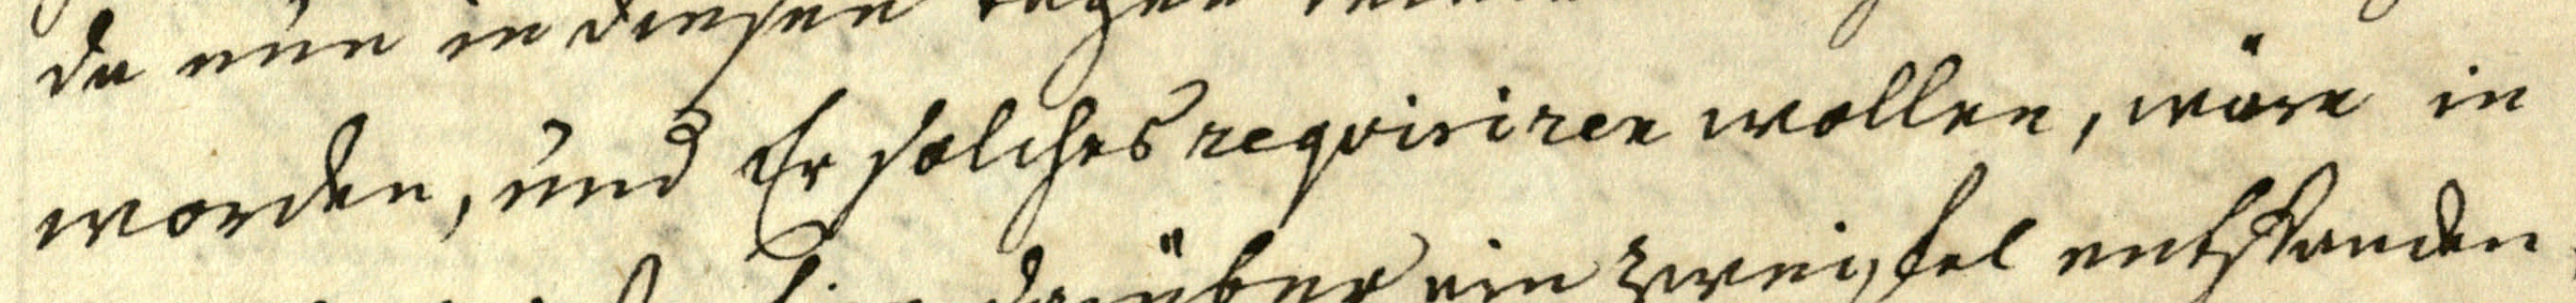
worden, und Er solches requiriren wollen, wäre in
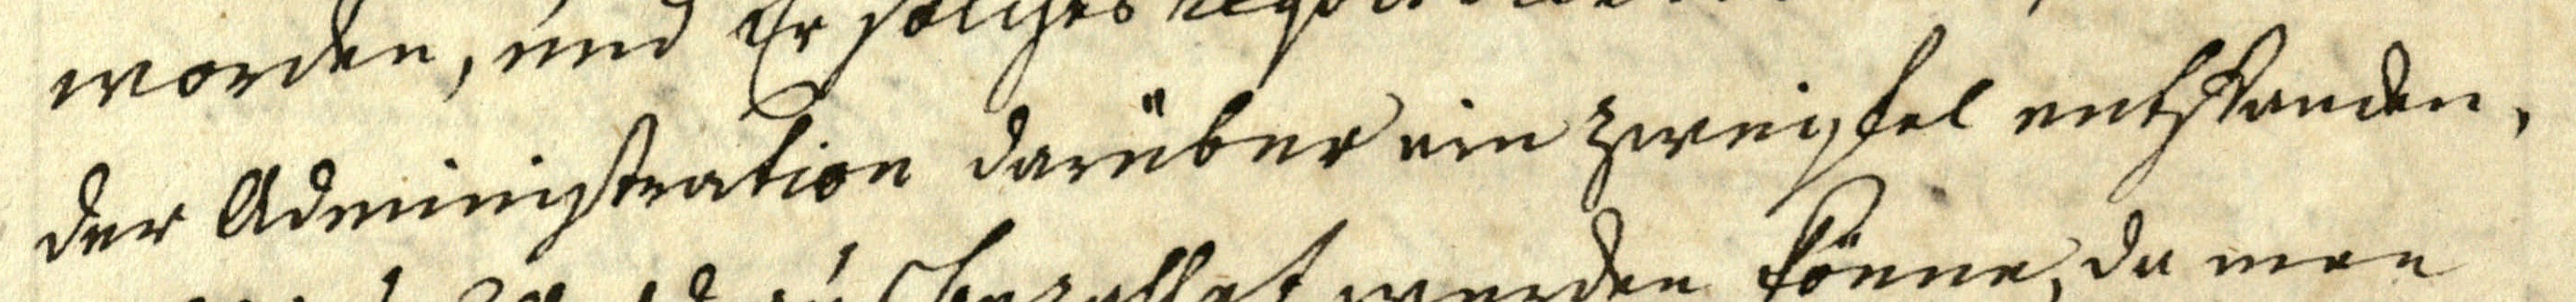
der Administration darüber ein Zweifel entstanden,
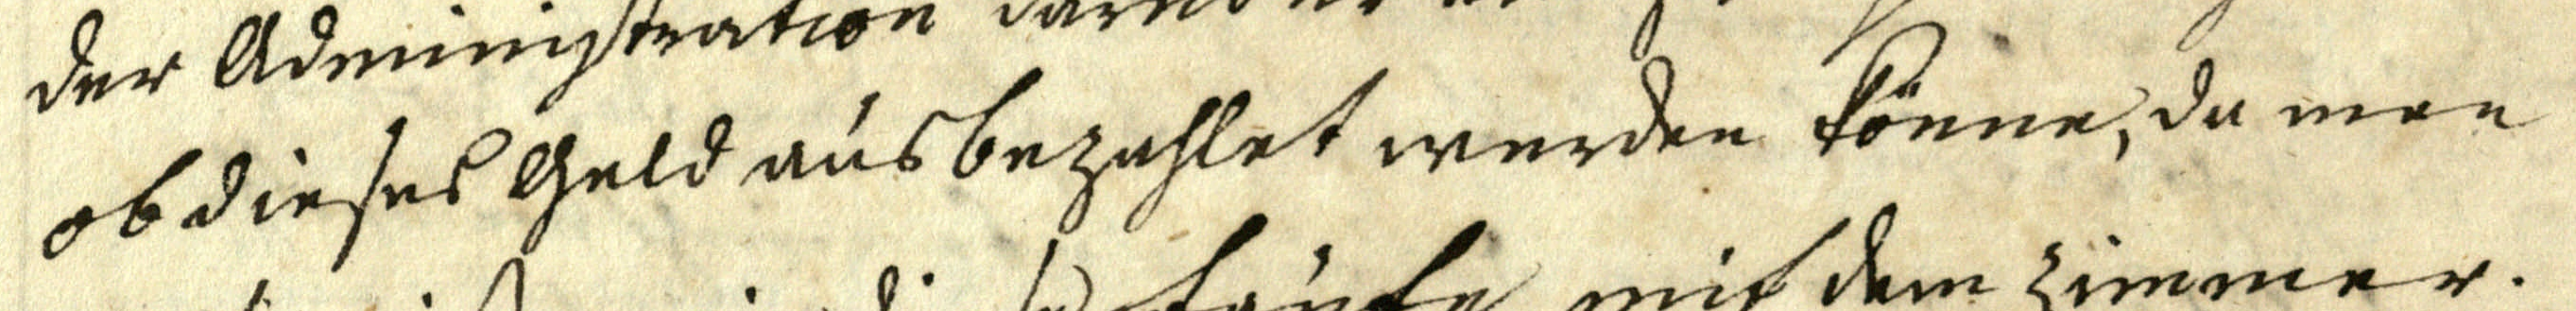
ob dieses Geld ausbezahlet werden könne, da man
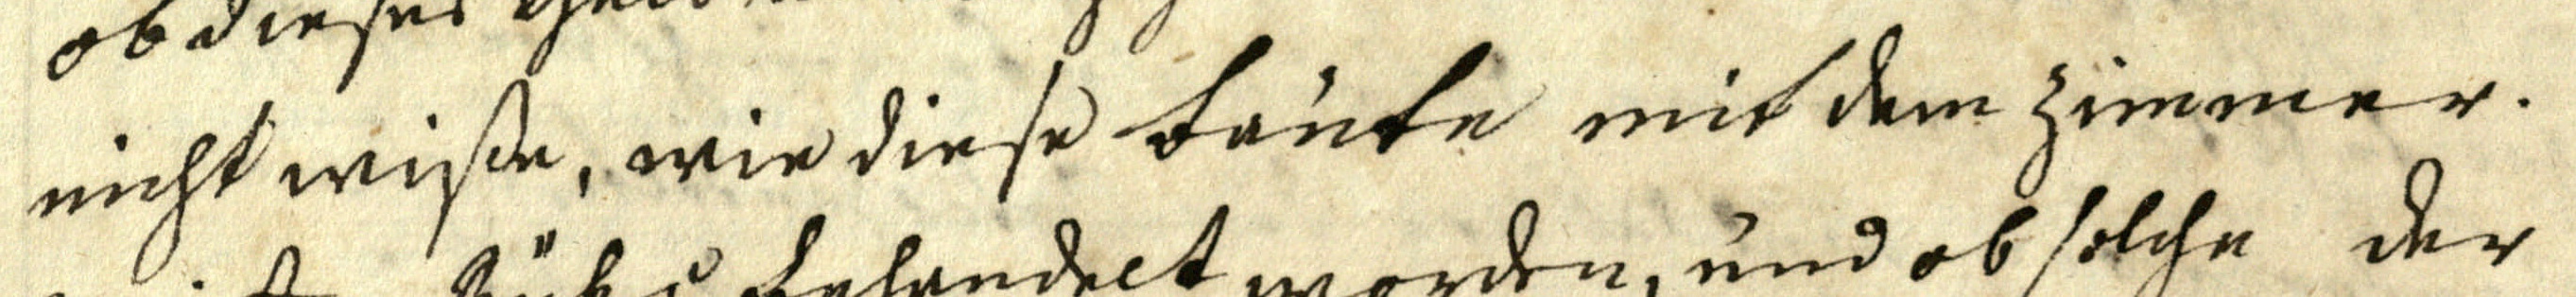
nicht wiße, wie diese Baute mit dem Zimmer¬
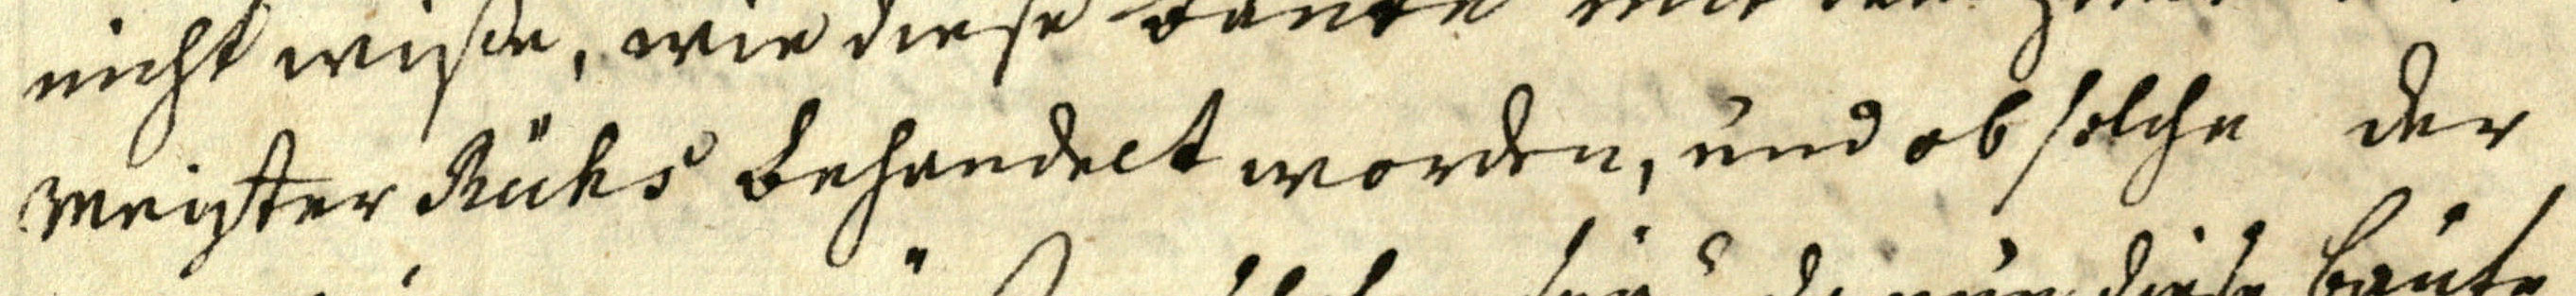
meister Rühs behandelt worden, und ob solche der
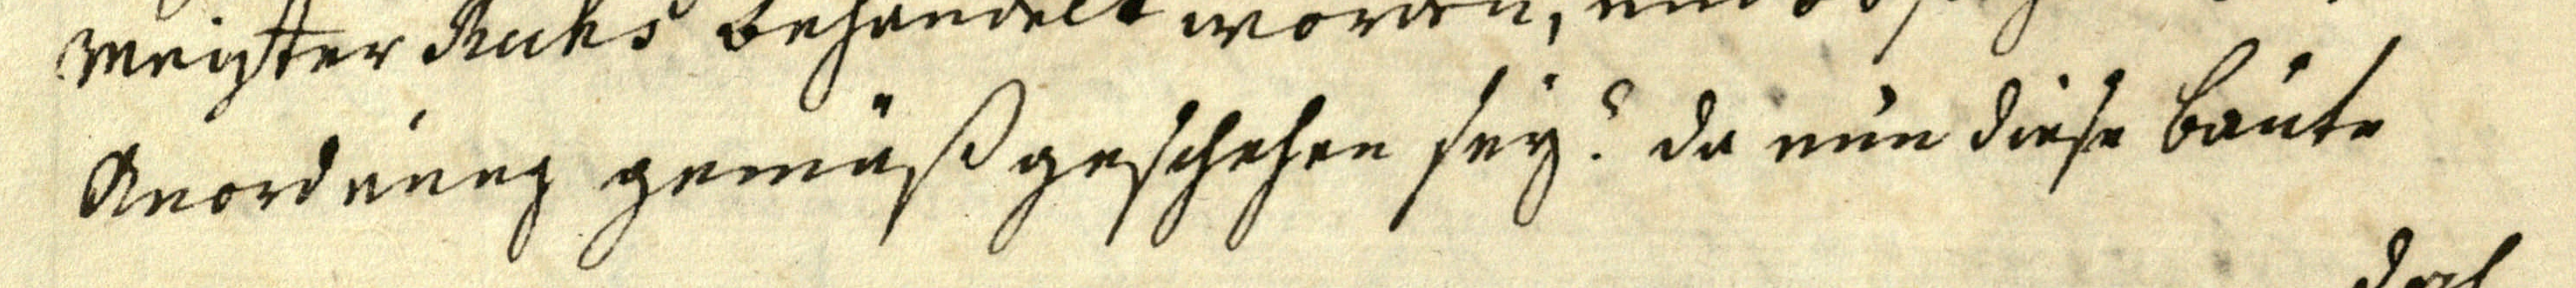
Anordnung gemäß geschehen seÿ? da nun diese Baute
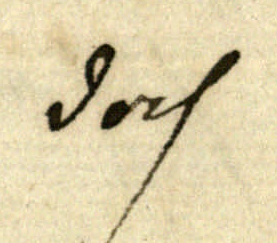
doch
